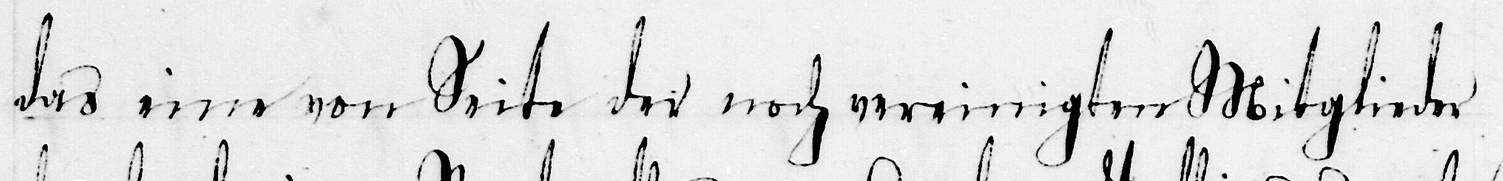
das eine von Seite der noch vereinigten Mitglieder
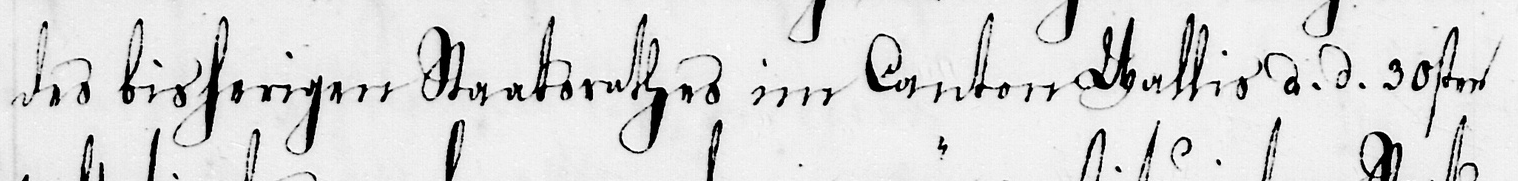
des bisherigen Staatsrathes im Canton Wallis d. d. 30sten
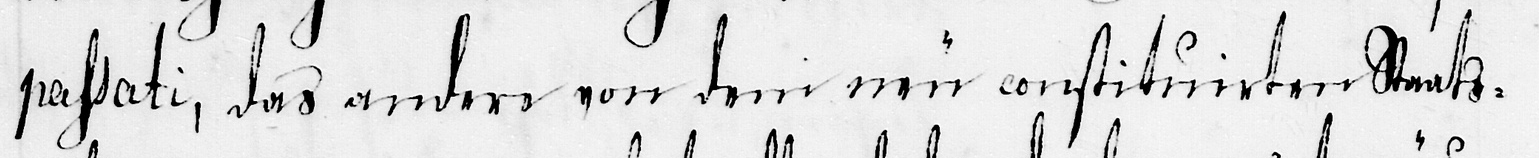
passati, das andere von dem neu constituirten Staats¬
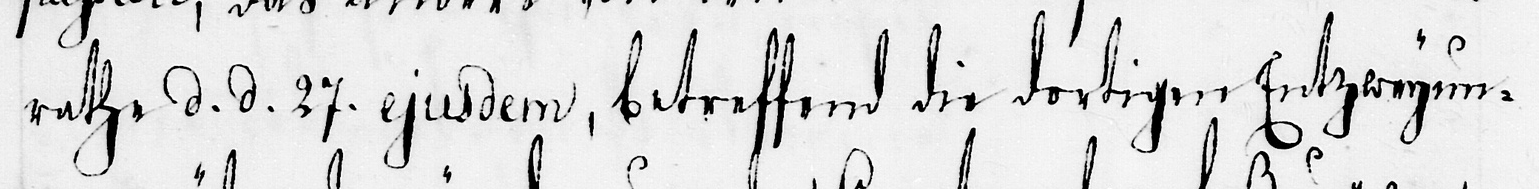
rathe d. d. 27. ejusdem, betreffend die dortigen Entzweyun¬
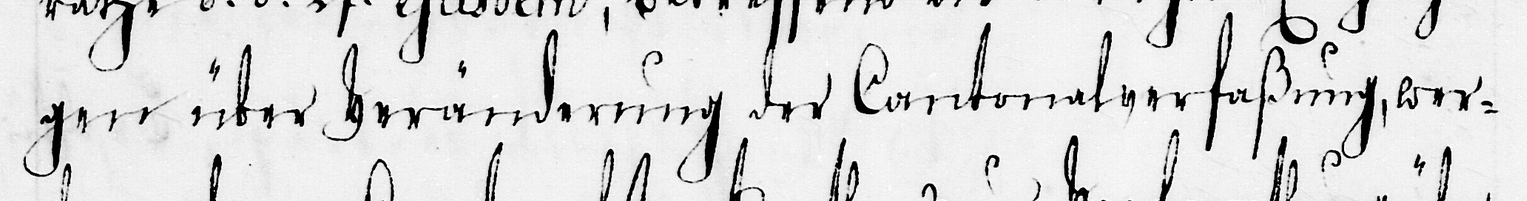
gen über Veränderung der Cantonalverfaßung, wer¬
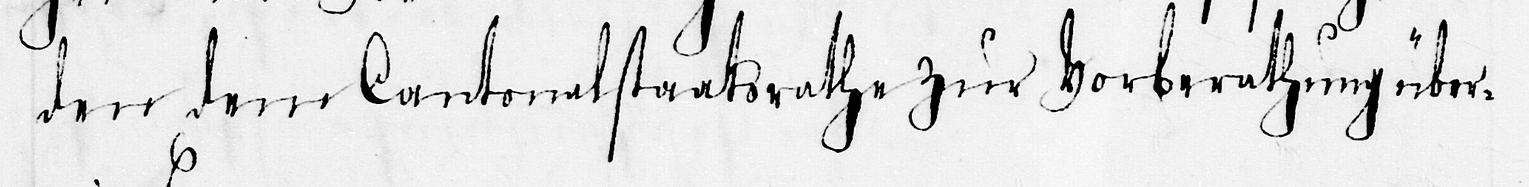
den dem Cantonalstaatsrathe zur Vorberathung über¬
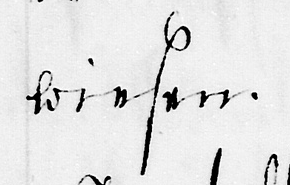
wiesen.
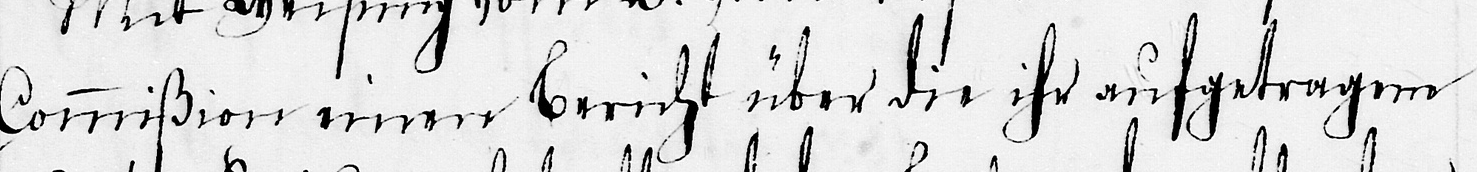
ommißion einen Bericht über die ihr aufgetragene
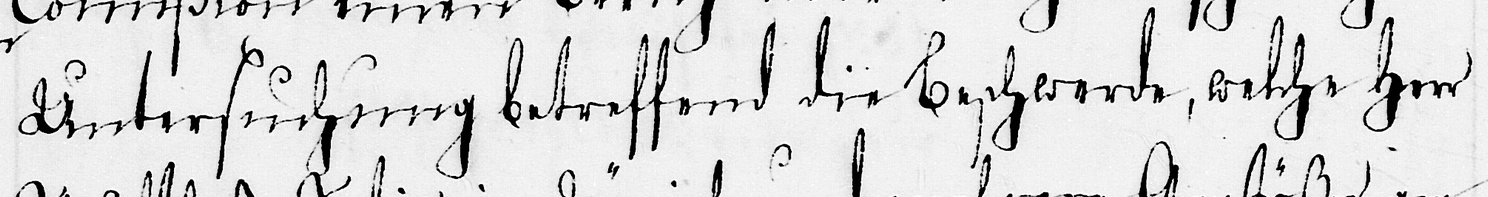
Untersuchung betreffend die Beschwerde, welche Herr
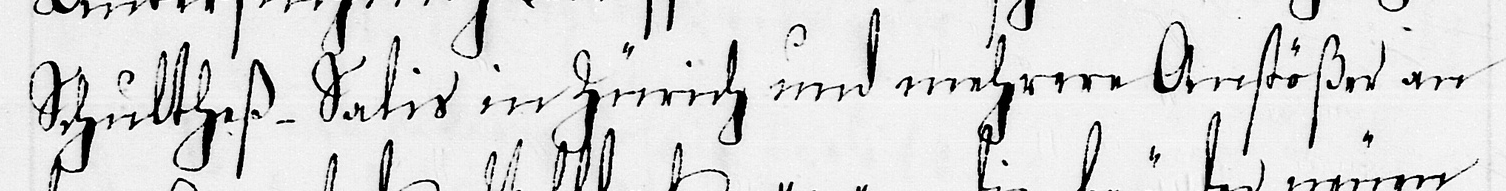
Schultheß-Salis in Zürich und mehrere Anstößer an
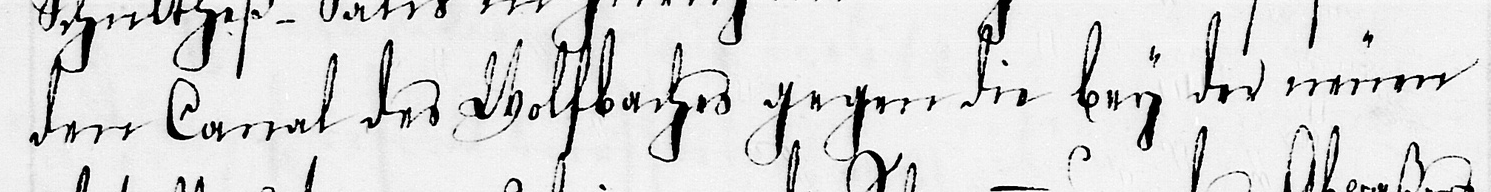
den Canal des Wolfbaches gegen die bey der neuen
